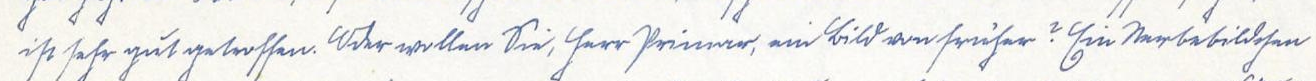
ist sehr gut getroffen. Oder wollen Sie, Herr Primar, ein Bild von früher? Ein Sterbebildchen
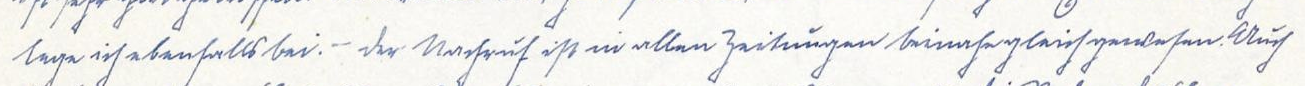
lege ich ebenfalls bei. Der Nachruf ist in allen Zeitungen beinahe gleich gewesen. Auch
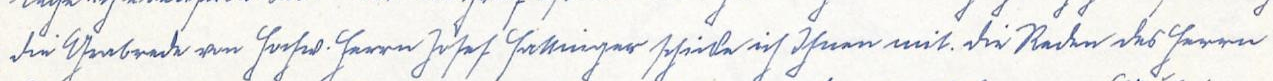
die Grabrede von Hochw. Herrn Josef Fattinger schicke ich Ihnen mit. Die Rede des Herrn
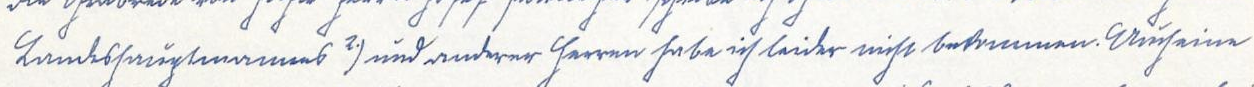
Landeshauptmanns 1) und anderer Herrn habe ich leider nicht bekommen. Auch eine
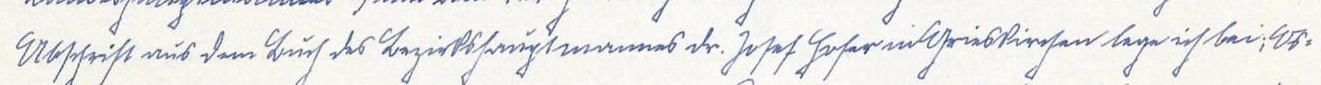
Abschrift aus dem Buch des Bezirks Hauptmannes Dr. Josef Hofer in Grieskirchen lege ich bei. Os-
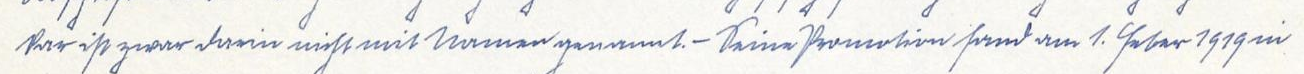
kar ist zwar darin nicht mit Namen genannt. Seine Promotion fand am 1. Februar 1919 in
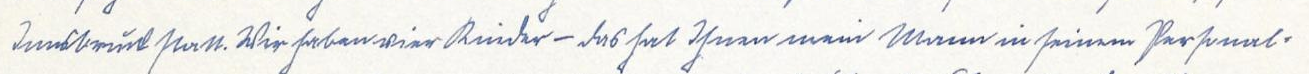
Innsbruck statt. Wir haben vier Kinder - Das hat ihnen mein Mann in seinem Personal-
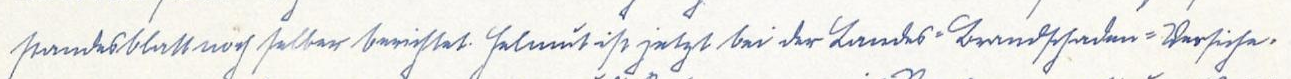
standesblatt noch selber berichtet. Helmut ist jetzt bei der Landes-Brandschaden Versiche
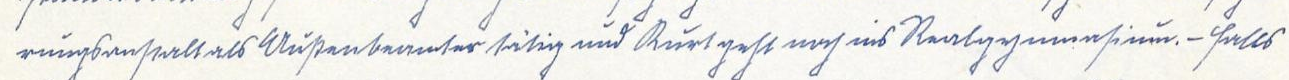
rungsanstalt als Außenbeamter tätig und Kurt geht noch ins Realgymnasium.- Falls
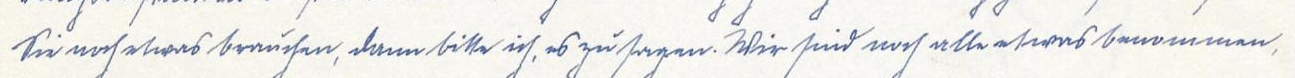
Sie noch etwas brauchen, dann bitte ich, es zu sagen. Wir sind noch alle etwas benommen,
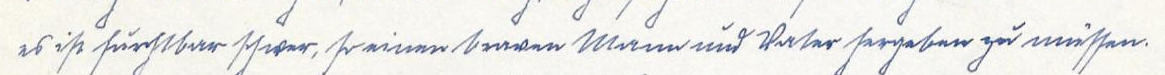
es ist furchtbar schwer, so einen braven Mann und Vater hergeben zu müssen.
